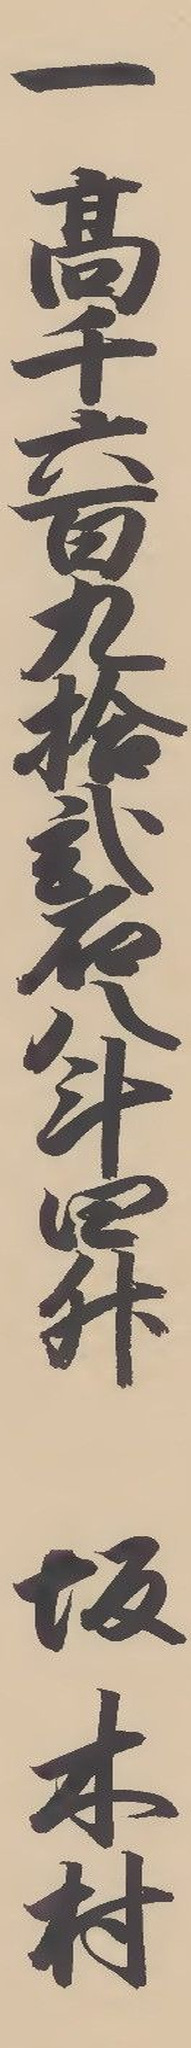一高千六百九拾弐石八斗四升坂木村
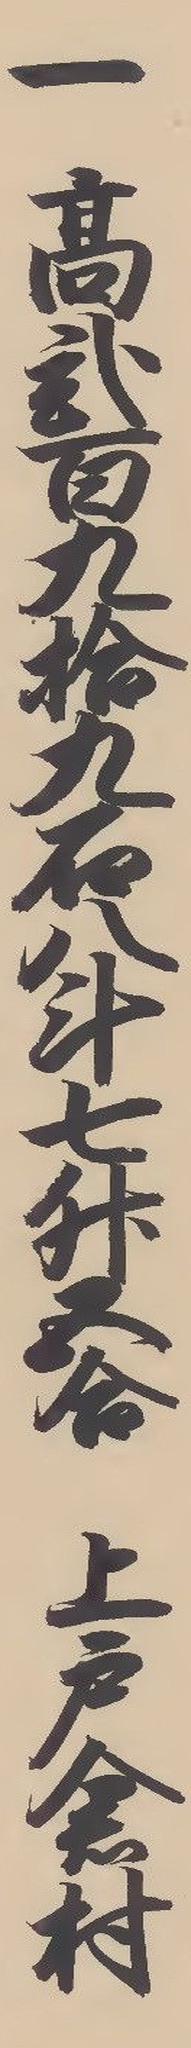一高弐百九拾九石八斗七升五合上戸倉村
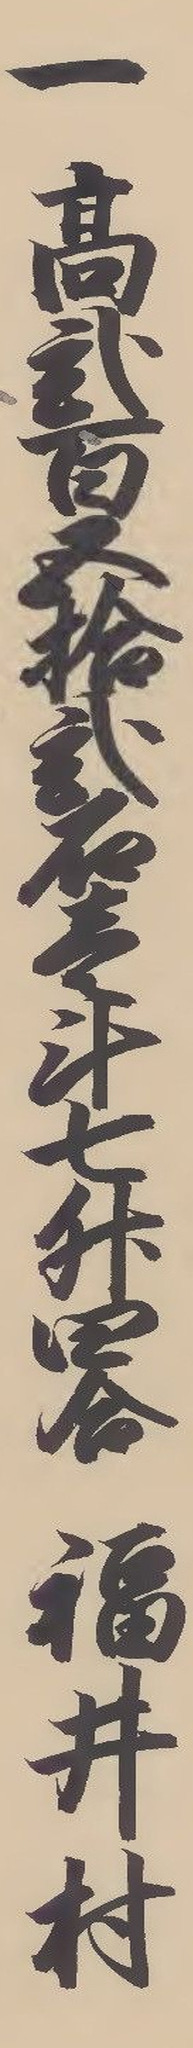一高弐百五拾弐石壱斗七升四合福井村

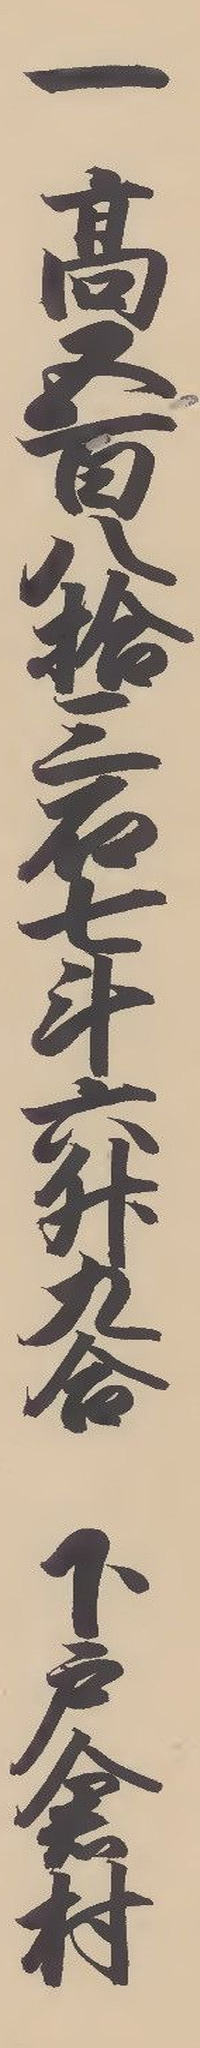一高五百八拾三石七斗六升九合下戸倉村
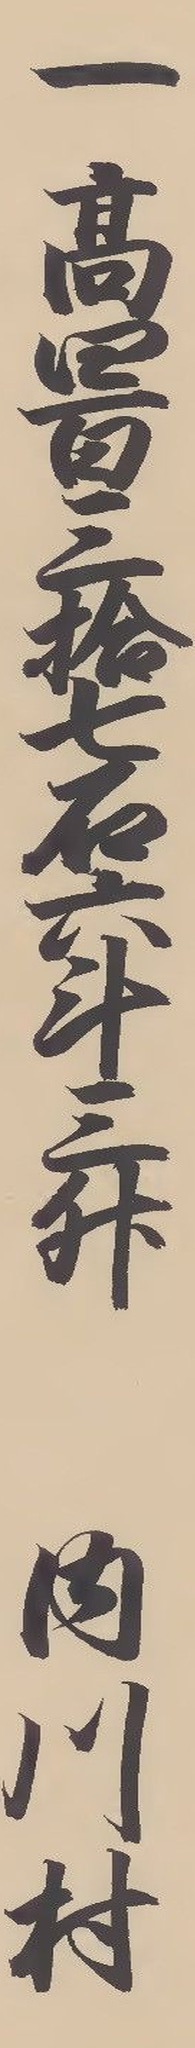一高四百三拾七石六斗三升内川村
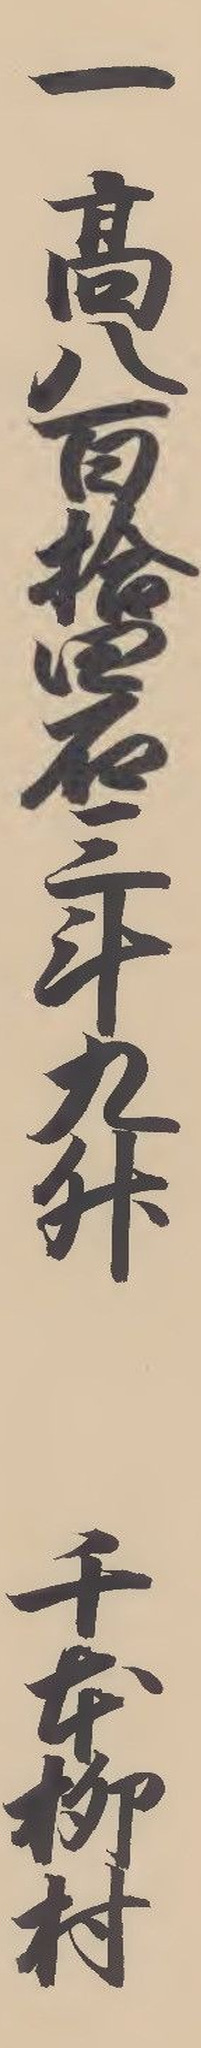一高八百拾四石三斗九升千本柳村
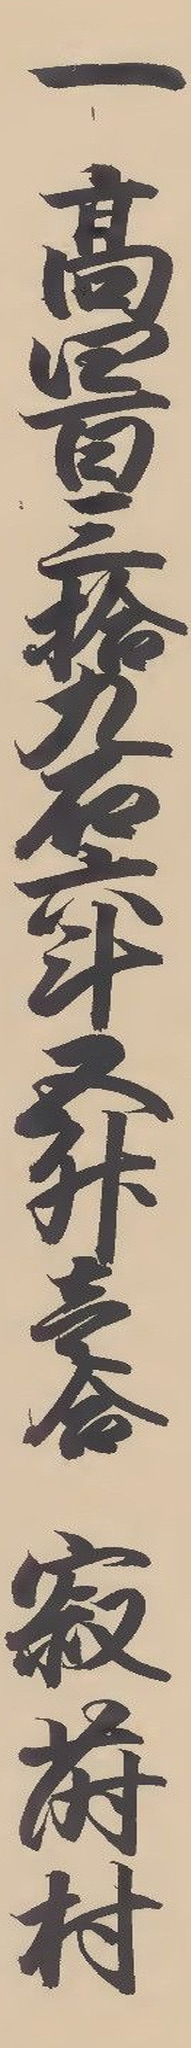一高四百三拾九石六斗五升壱合寂蒔村
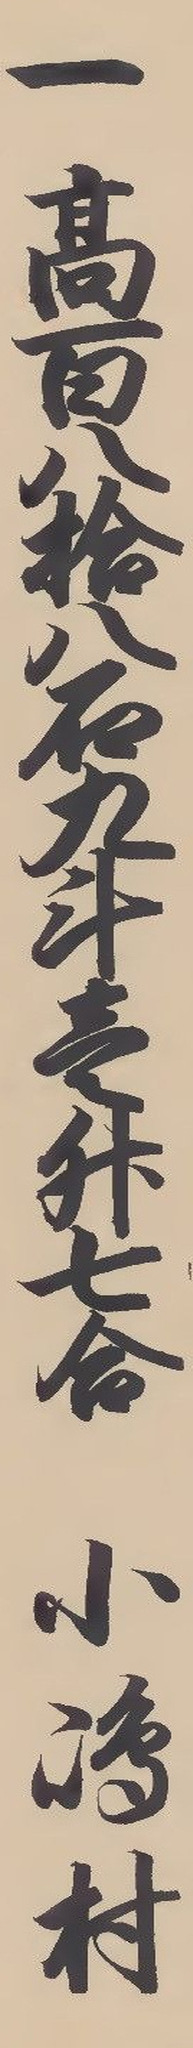一高百八拾八石九斗壱升七合小島村
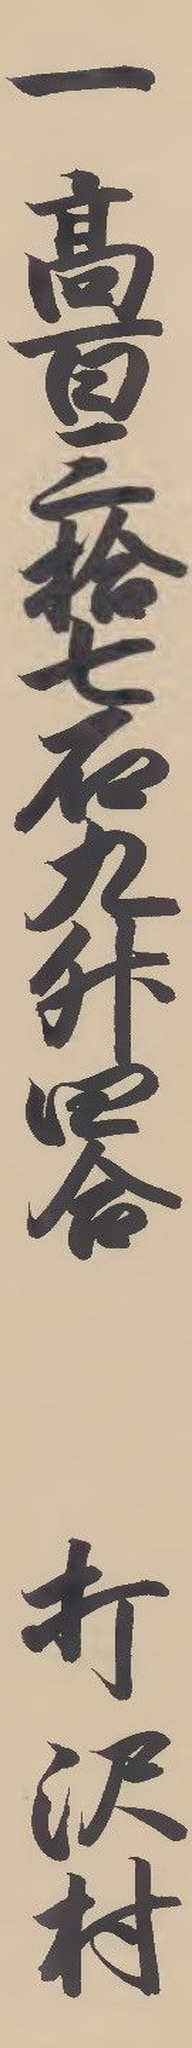一高百三拾七石九升四合打沢村
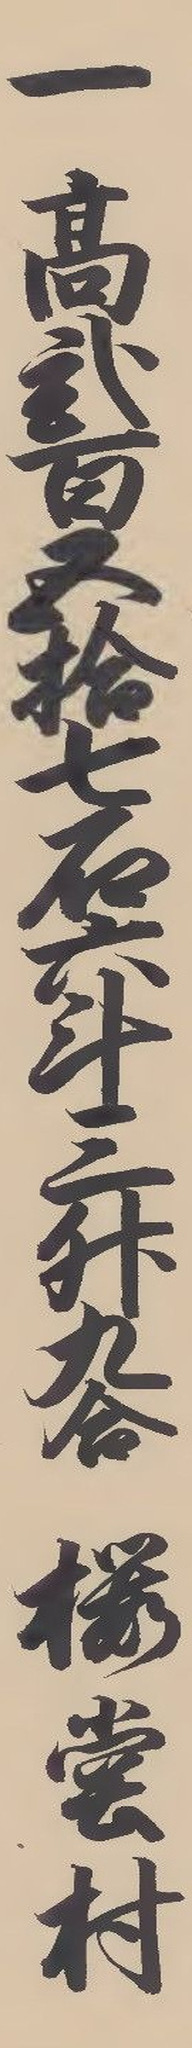一高弐百五拾七石六斗三升九合桜堂村
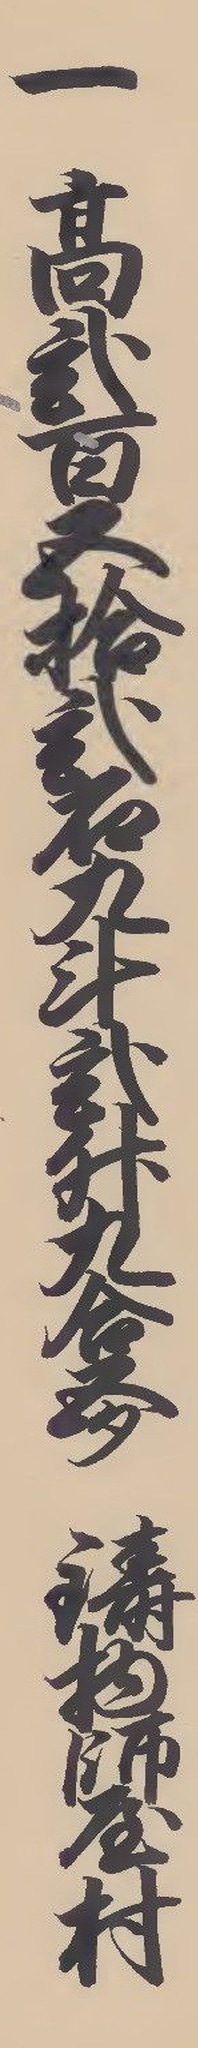一高弐百五拾弐石九斗弐升九合五勺鋳物師屋村

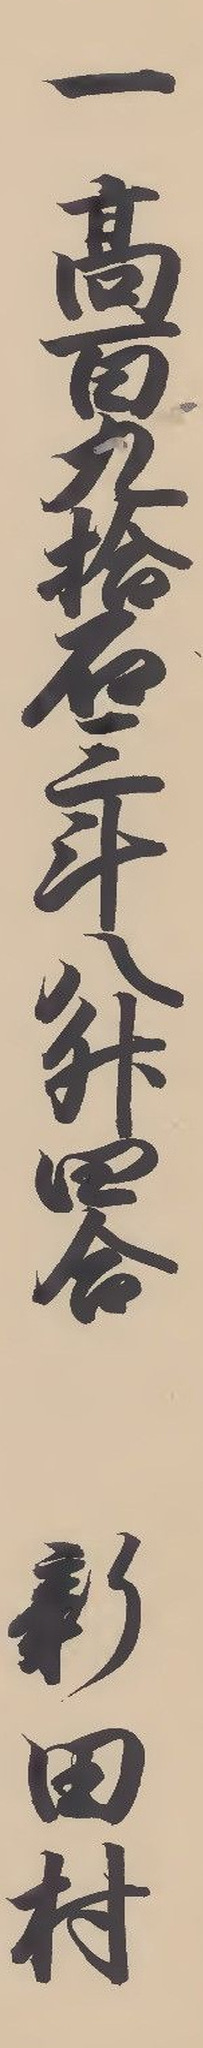一高百九拾石三斗八升四合新田村
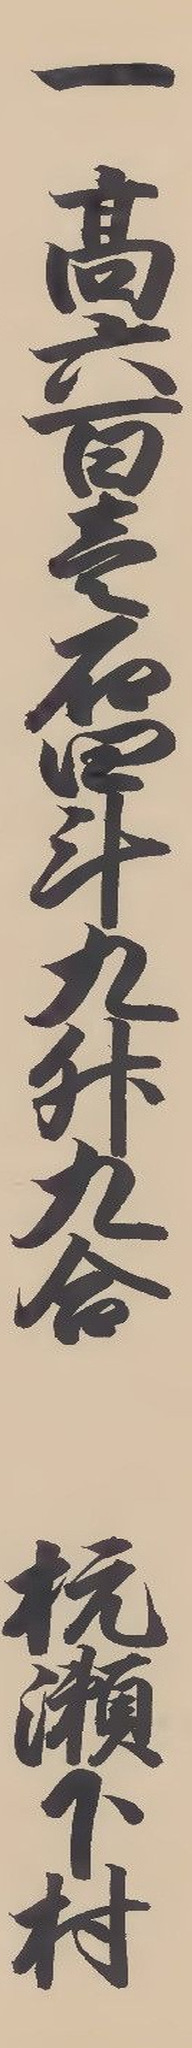一高六百壱石四斗九升九合杭瀬下村
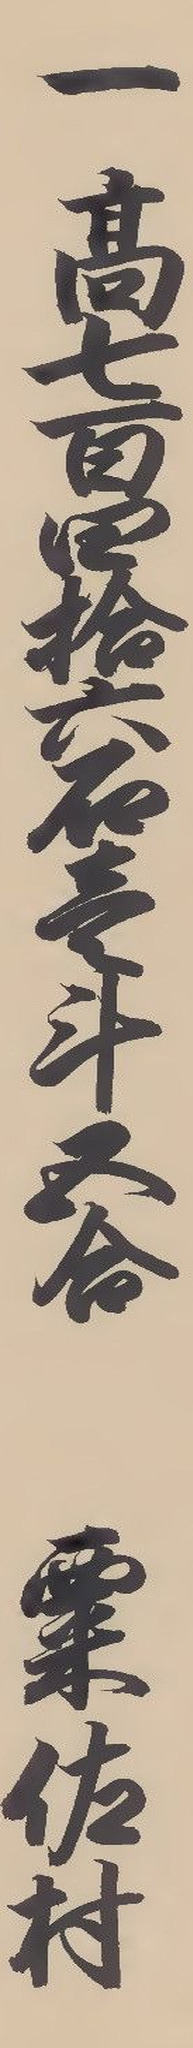一高七百四拾六石壱斗五合粟佐村
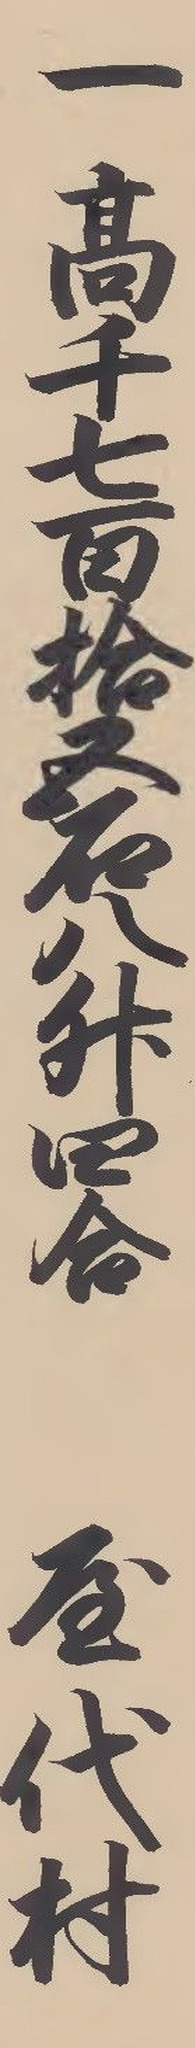一高千七百拾五石八升四合屋代村
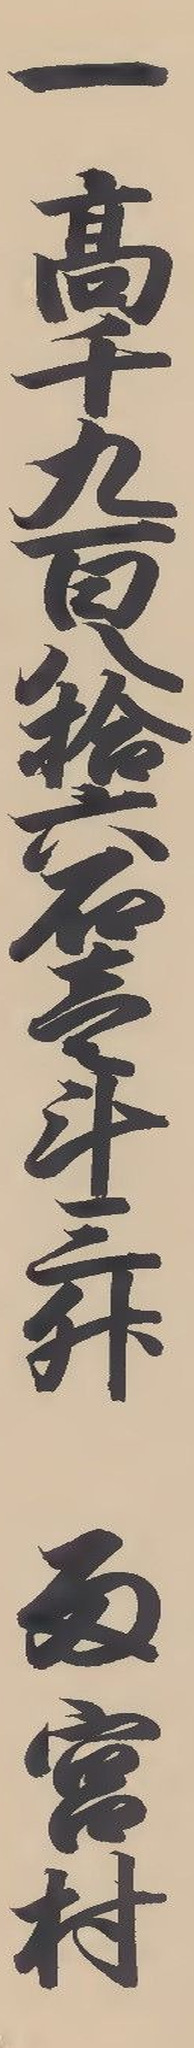一高千九百八拾六石壱斗三升雨宮村
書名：信濃国郷帳
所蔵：国立公文書館 National Archives of Japan
